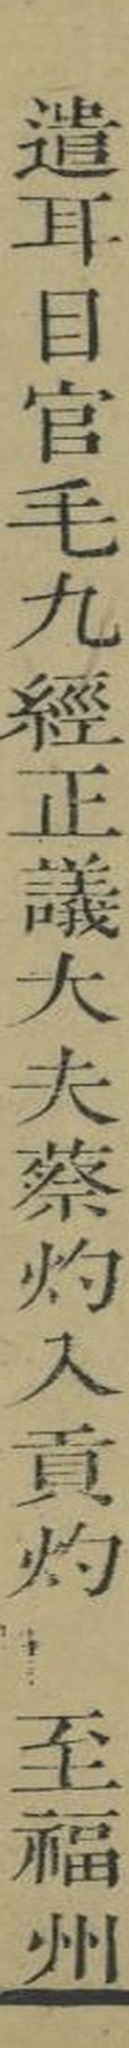遣耳目官毛九経正議大夫蔡灼入貢灼至福州
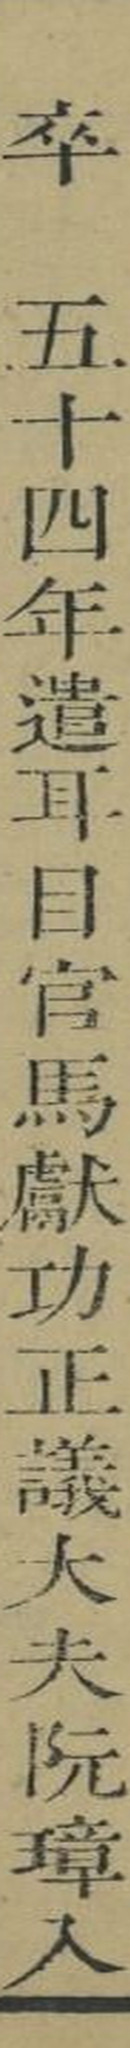卒五十四年遣耳目官馬献功正議大夫阮璋入
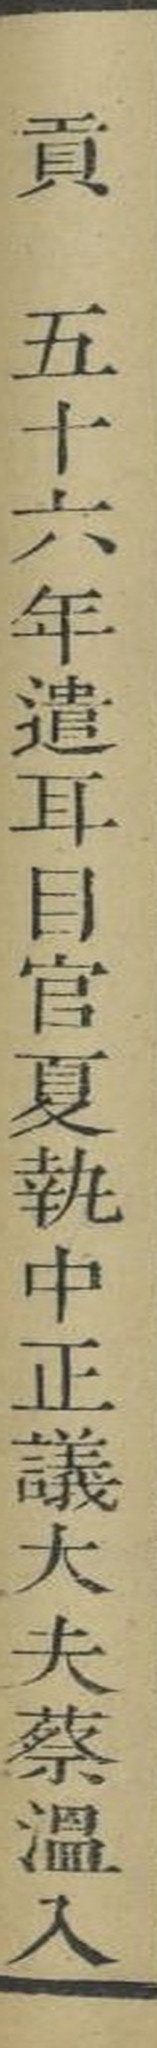貢五十六年遣耳目官夏執中正議大夫蔡温入
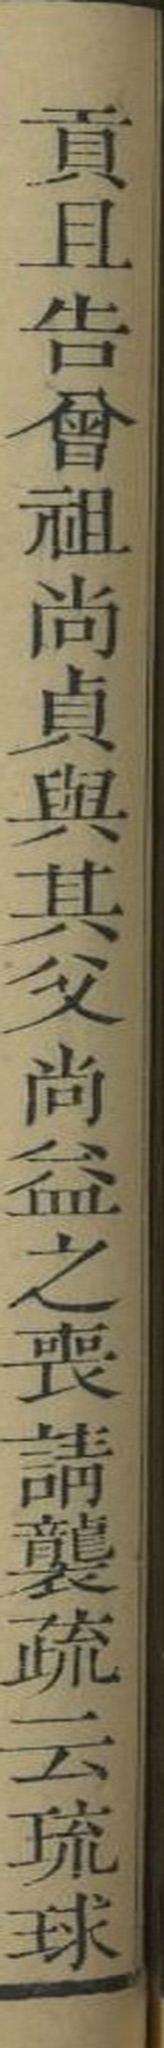貢且告曽祖尚貞与其父尚益之喪請襲疏云琉球
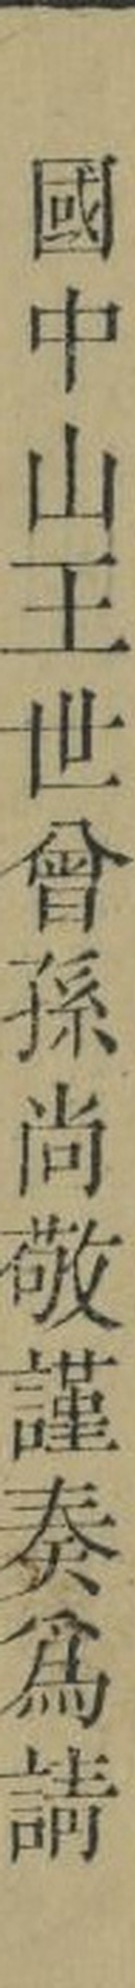国中山王世曽孫尚敬謹奏為請
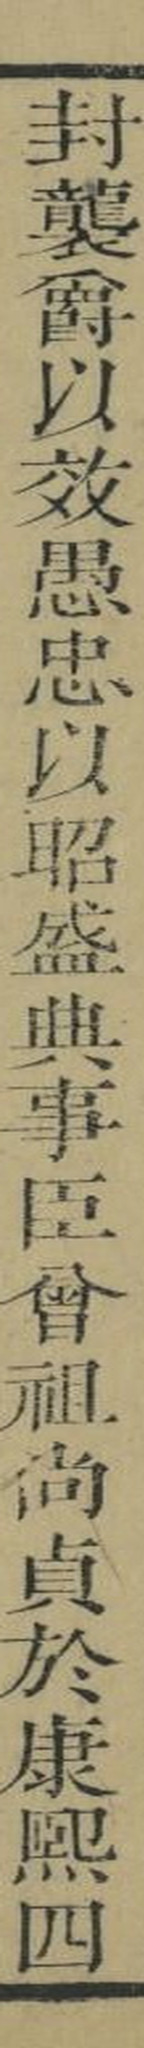封襲爵以効愚忠以昭盛典事臣曽祖尚貞於康煕四
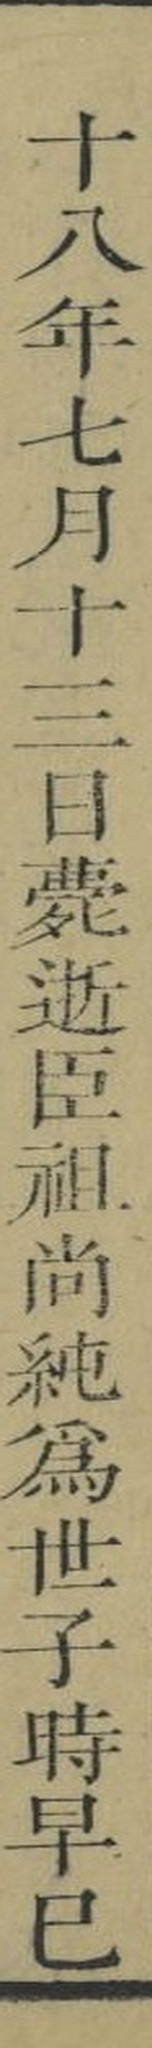十八年七月十三日薨逝臣祖尚純為世子時早巳
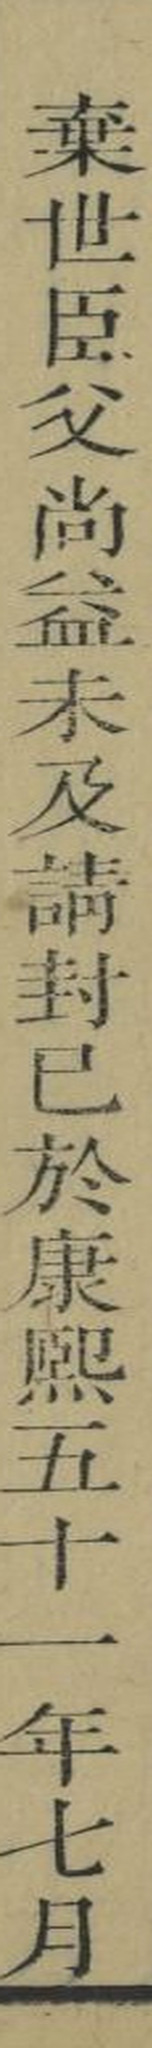棄世臣父尚益未及請封巳於康煕五十一年七月
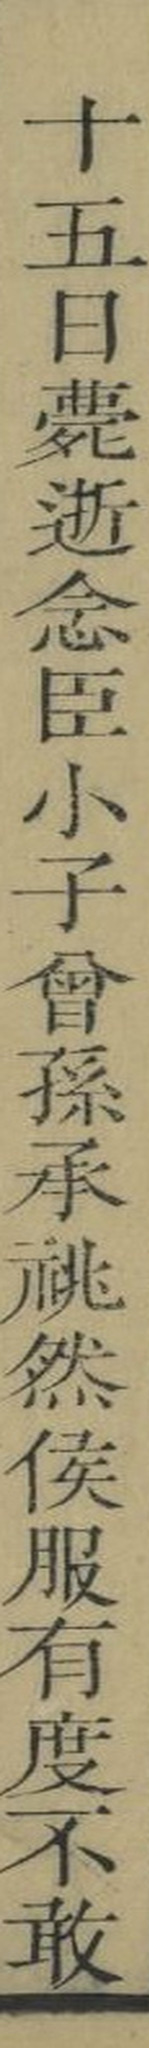十五日薨逝念臣小子曽孫承祧然侯服有度不敢
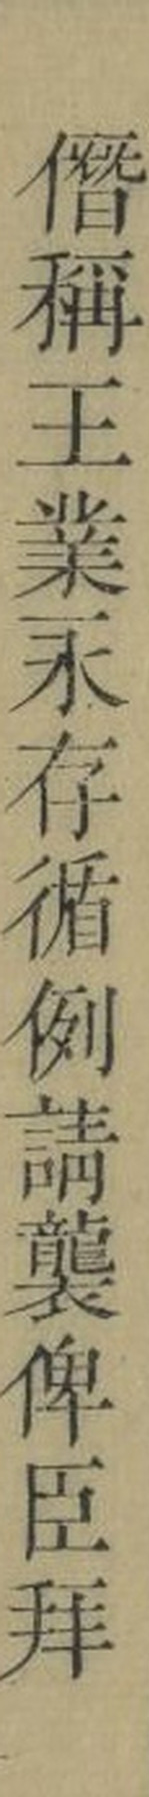僭称王業永存循例請襲俾臣拝
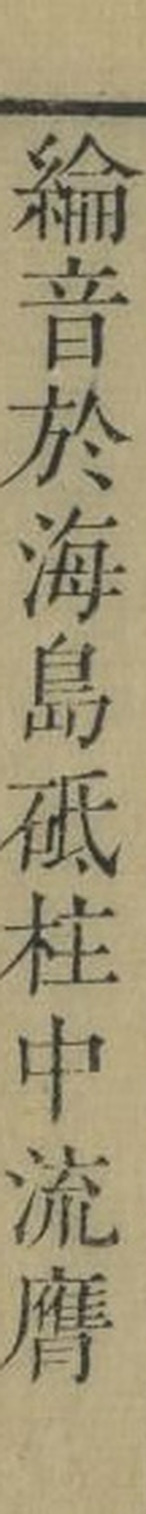綸音於海島砥柱中流膺
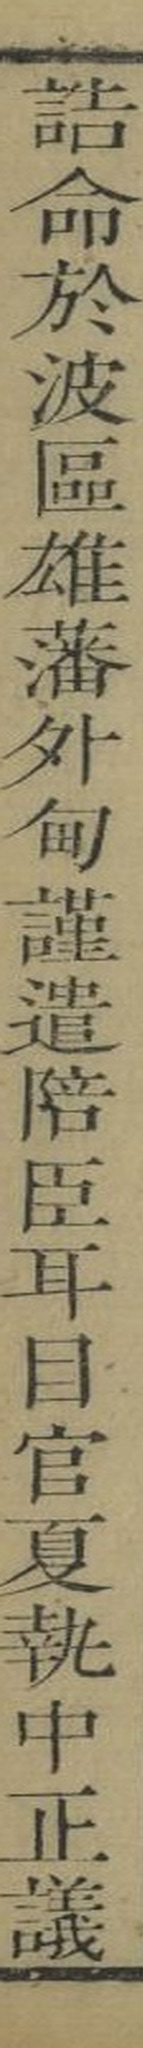誥命於波区雄藩外甸謹遣陪臣耳目官夏執中正議

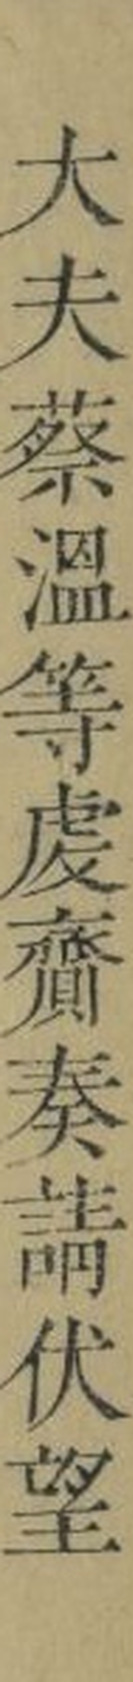大夫蔡温等虔齎奏請伏望
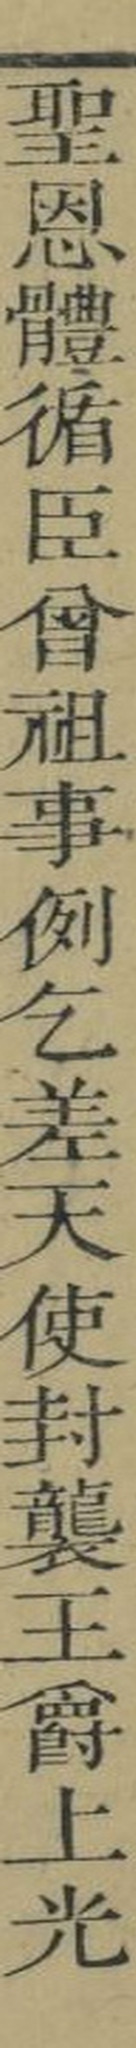聖恩体循臣曽祖事例乞差天使封襲王爵上光
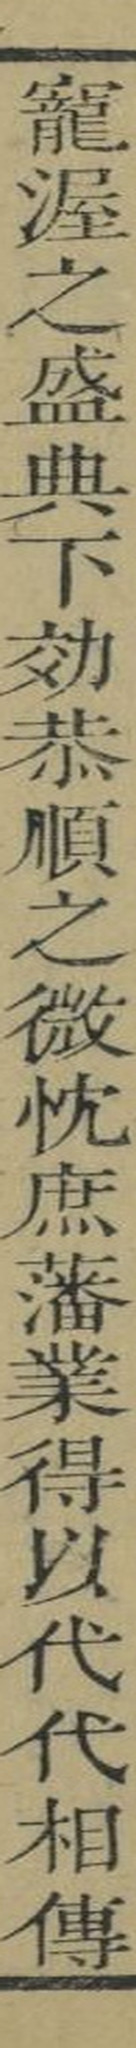寵渥之盛典下効恭順之微忱庶藩業得以代代相伝
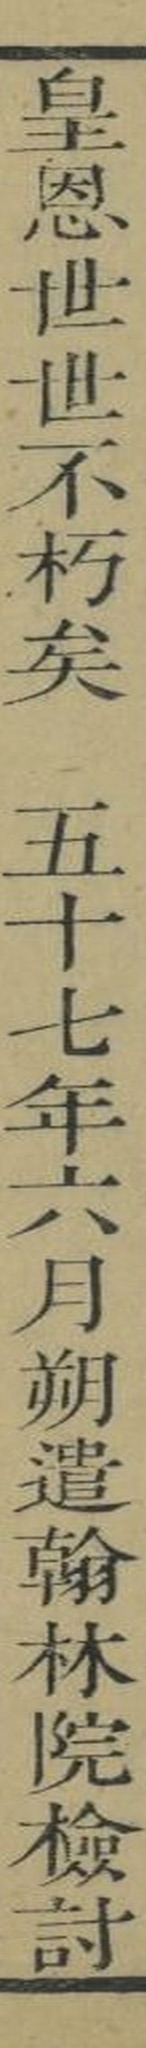皇恩世世不朽矣五十七年六月朔遣翰林院検討
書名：中山伝信録 巻三
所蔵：University of the Ryukyus Library
